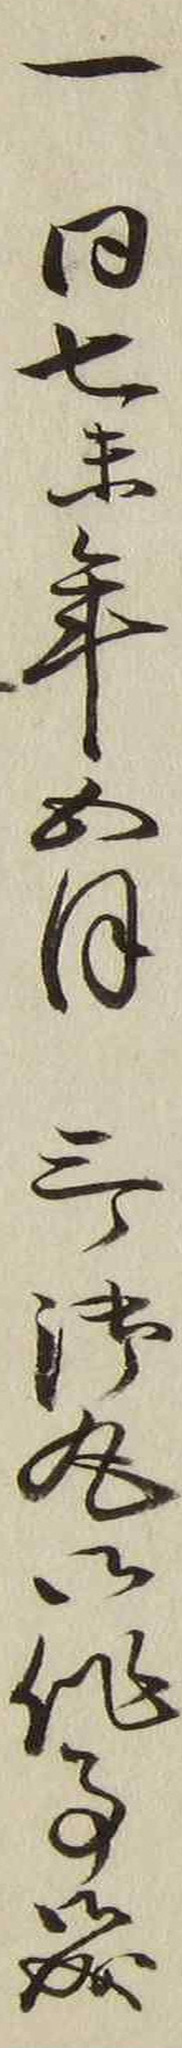一同七未年五月三ノ御丸御作事御成
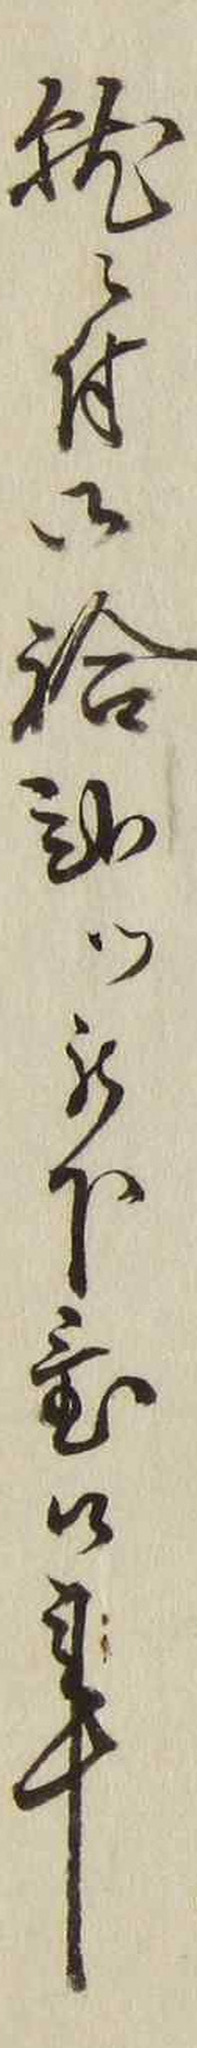就ニ付御袷弐ツ被下置候事

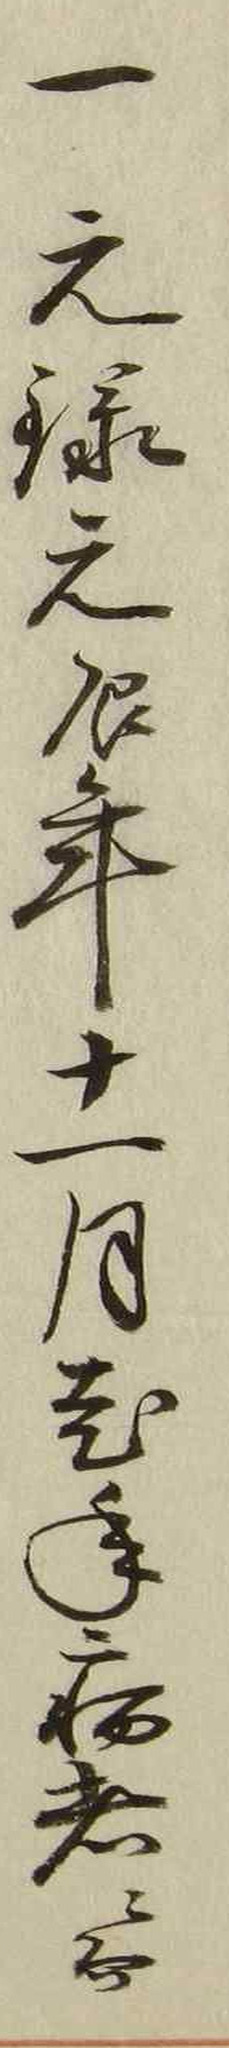一元禄元辰年十一月老年病者ニ而
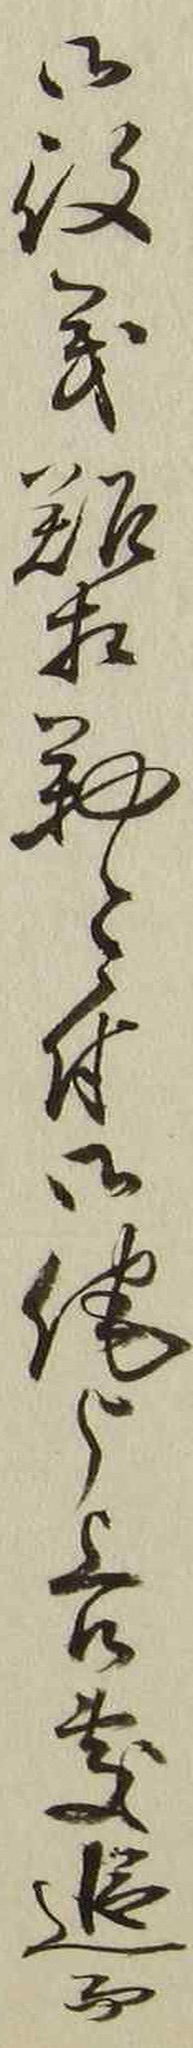御役義難相勤ニ付御侘申上候処追而
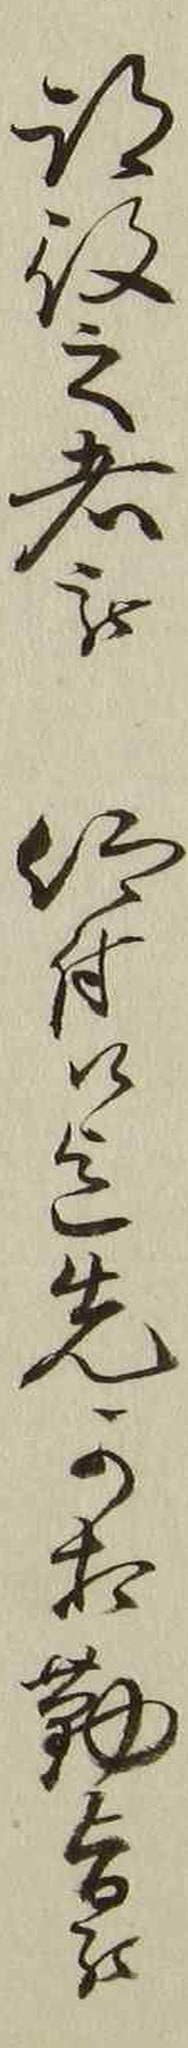跡役之者被仰付候迄先可相勤旨被
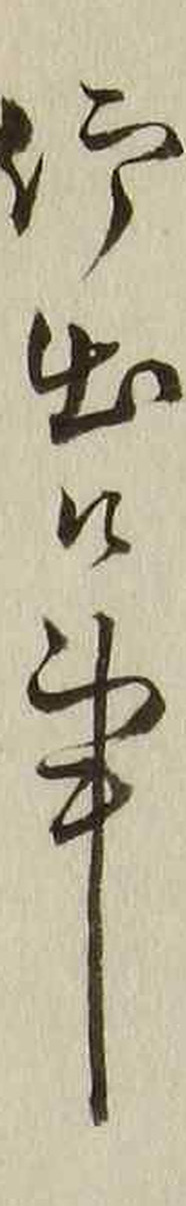仰出候事
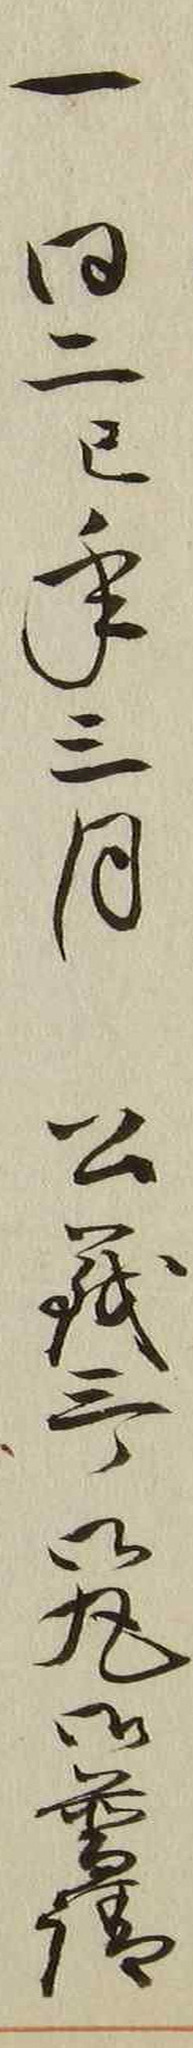一同二巳年三月公義三ノ御丸御普請
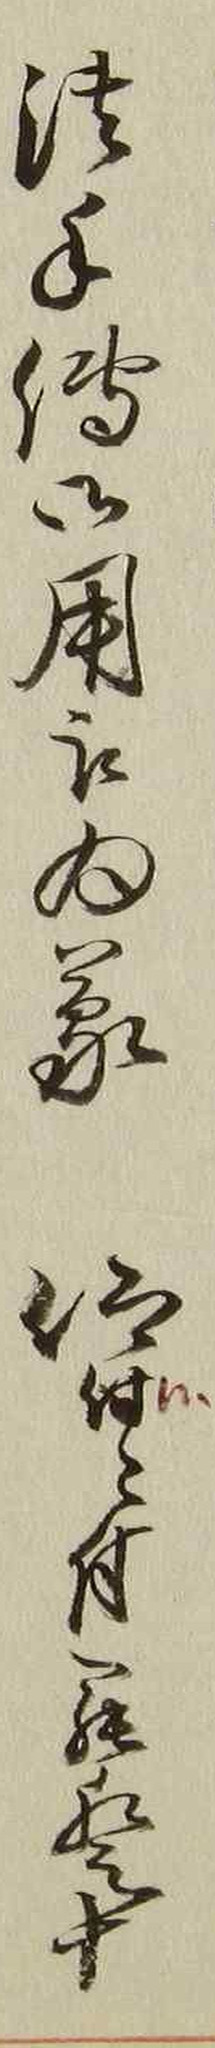御手伝御用被蒙仰候ニ付罷登十
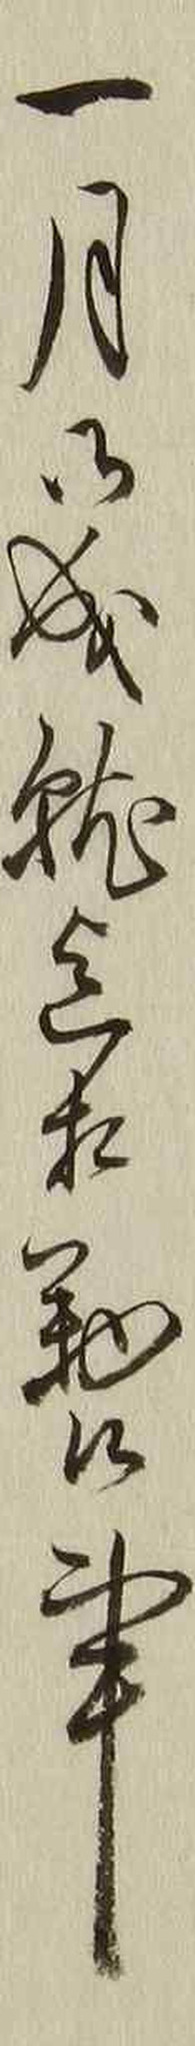一月御成就迄相勤候事
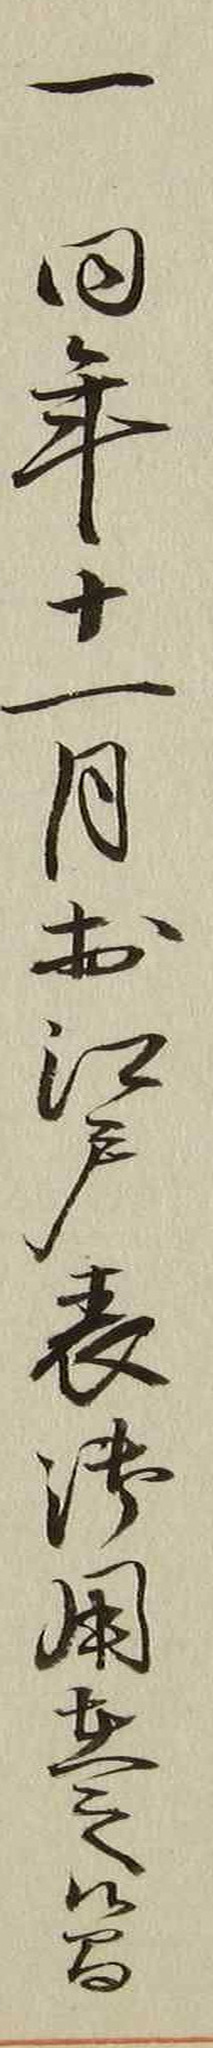一同年十一月於江戸表御用在之候間
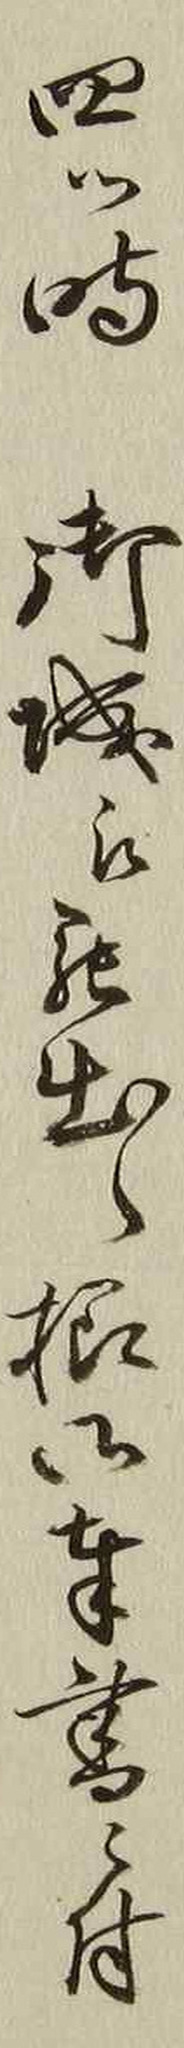四ツ時御城江罷出候様御奉書ニ付
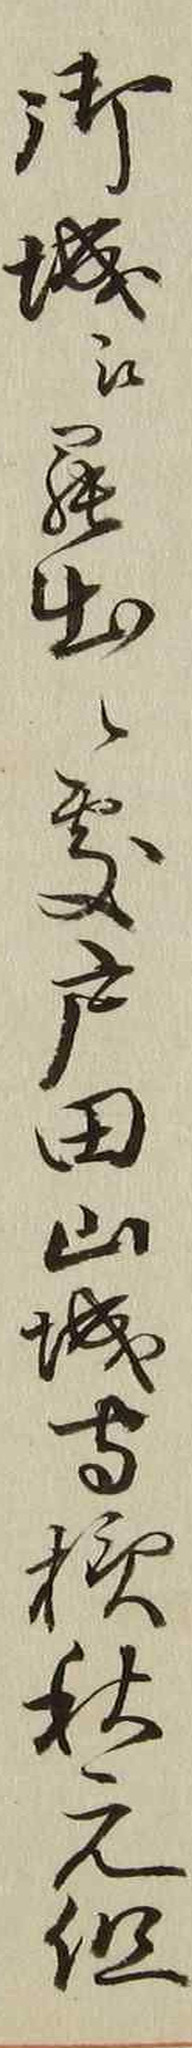御城江罷出候処戸田山城守様秋元但
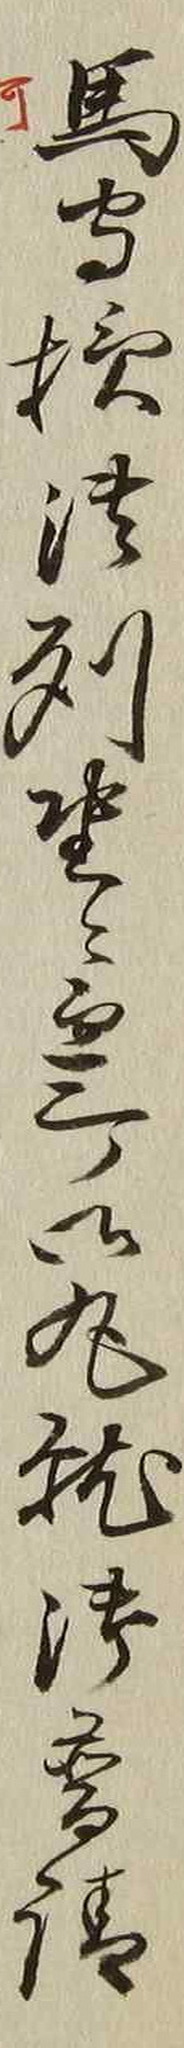馬守様御列座ニ而三ノ御丸就御普請
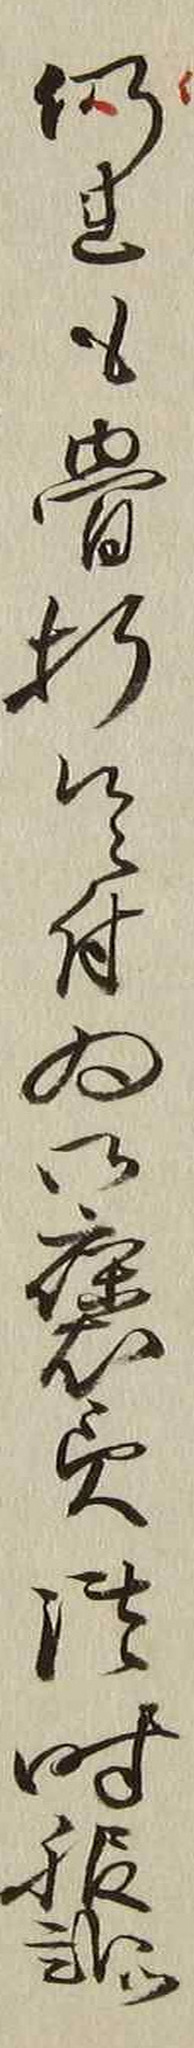何れも骨折候ニ付為御褒美御時服弐ツ
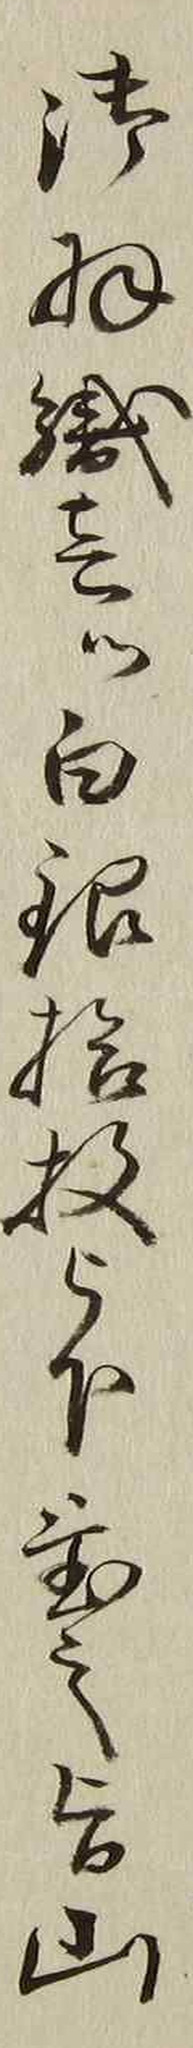御羽織壱ツ白銀拾枚被下置之旨山
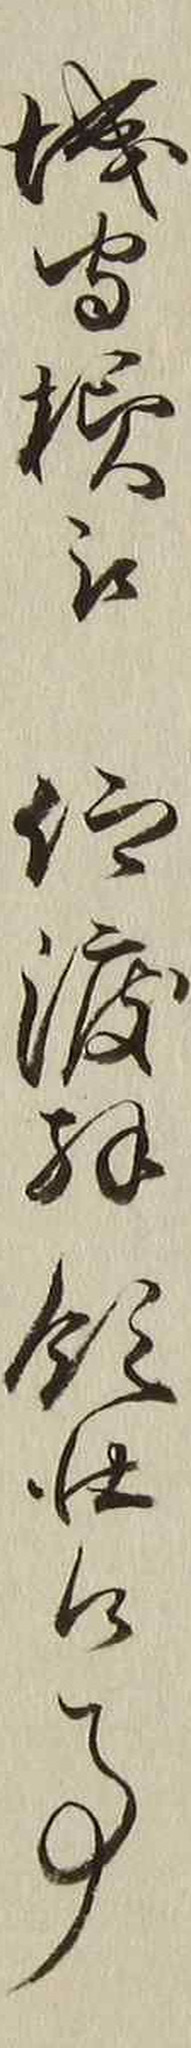城守様被仰渡拝領仕候事
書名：諸士系譜　巻之60　と之部3
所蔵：会津若松市立会津図書館
